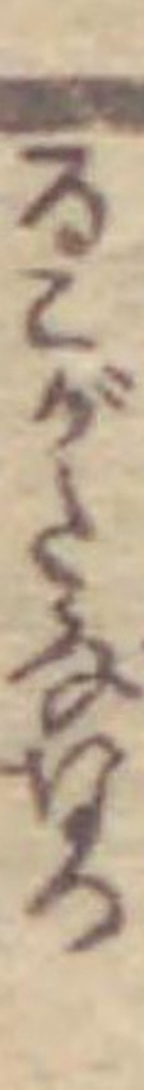るこがたななつ
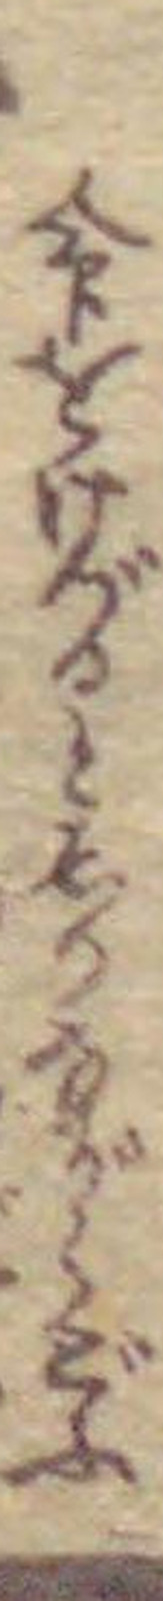命をけづるとしりながらどふ
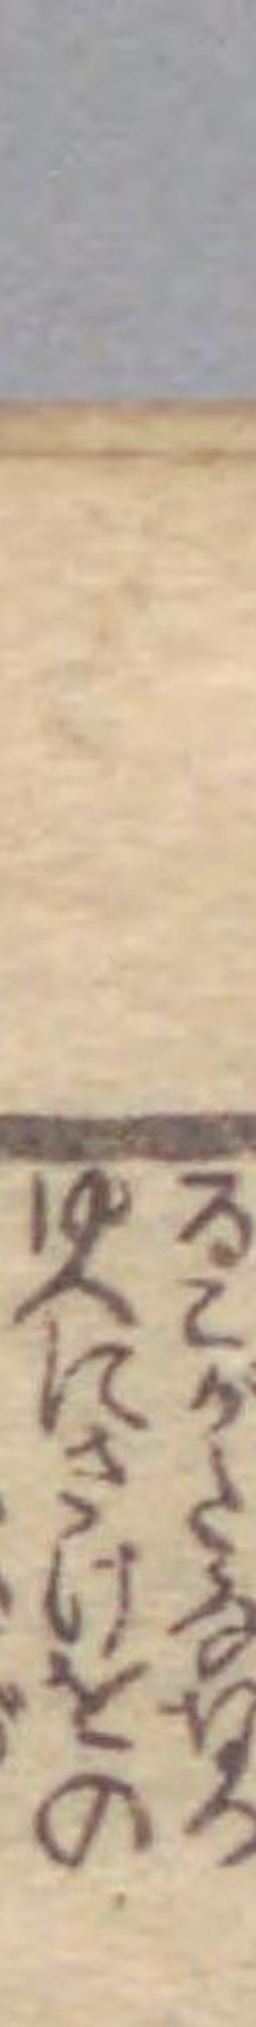ゆへにさけをの
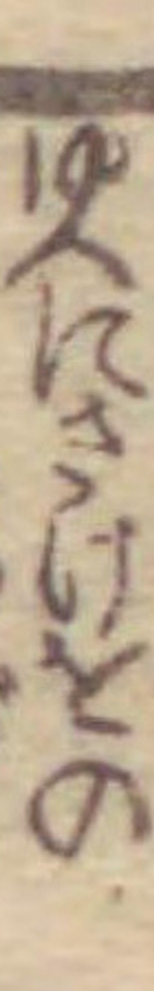ゆへにさけをの
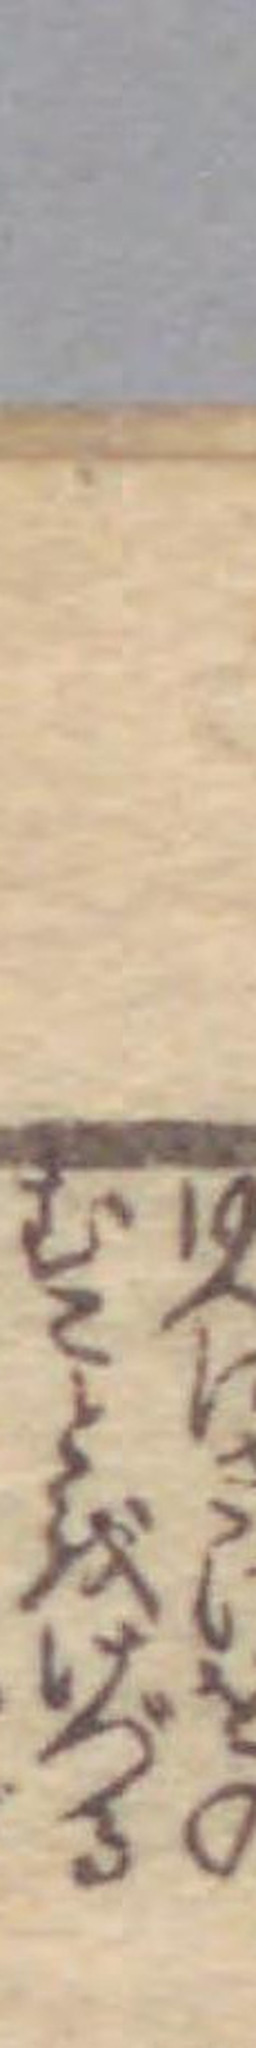むことをけづる
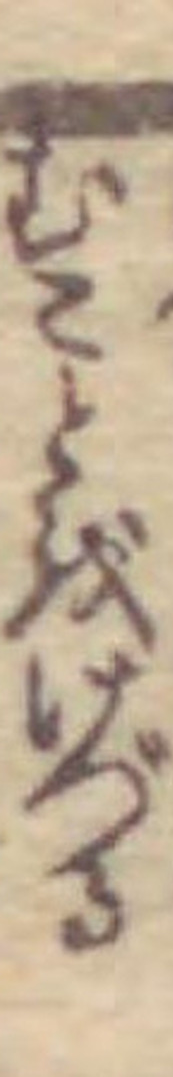むことをけづる
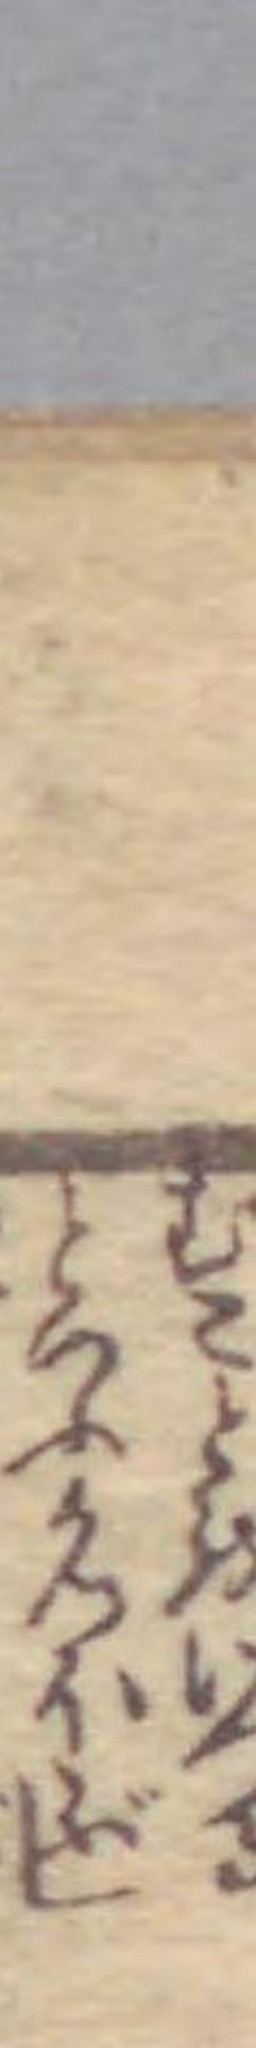といふかつほぶし
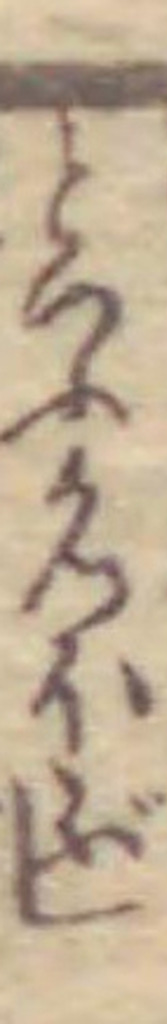といふかつほぶし
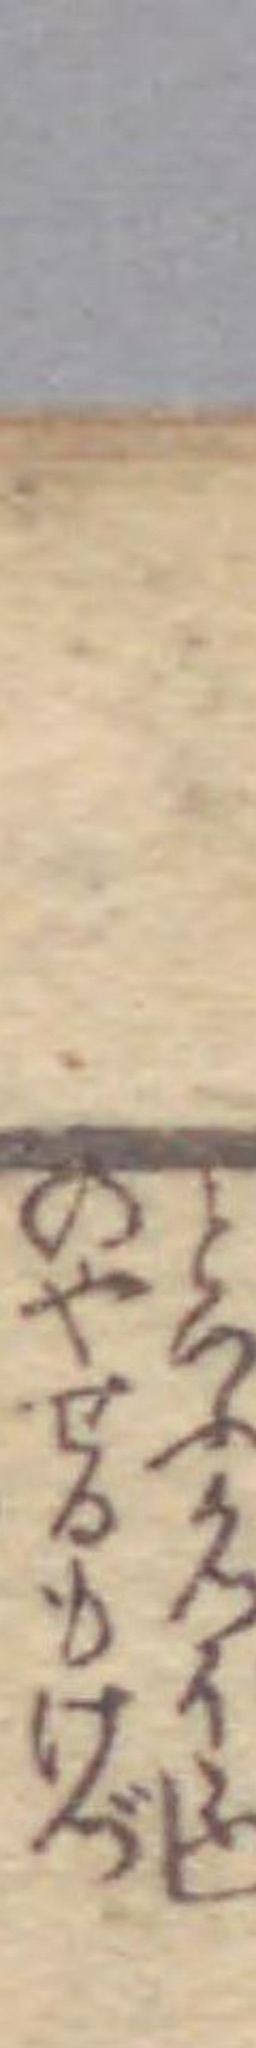のやせるもけづ
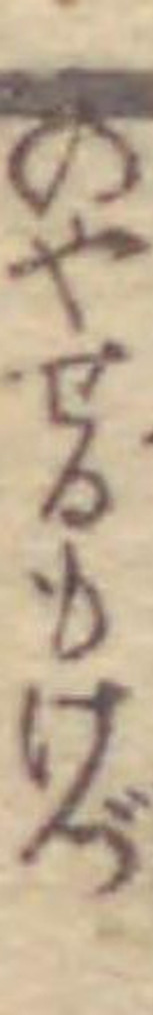のやせるもけづ
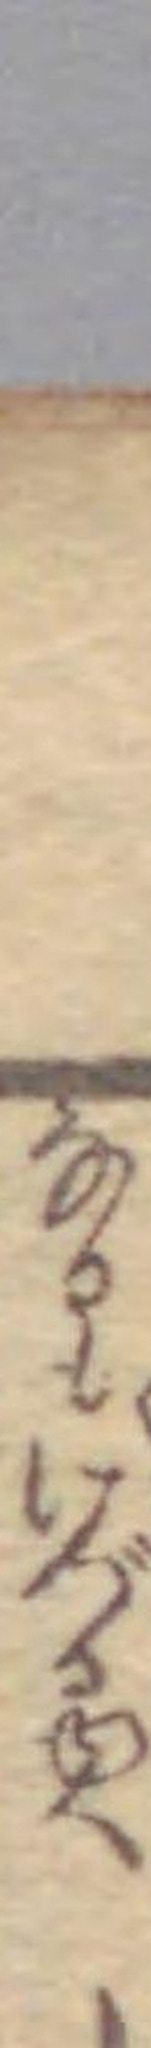なるもけづるゆへ
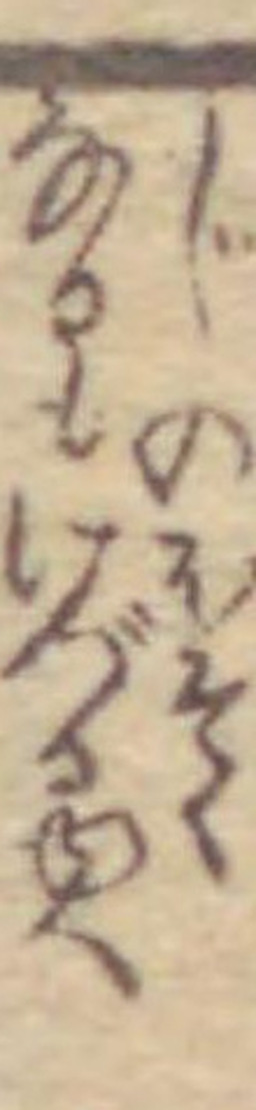なるもけづるゆへ
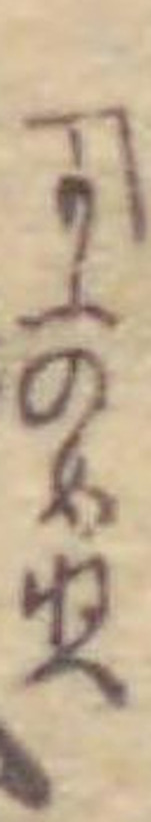〽もふのめねへ
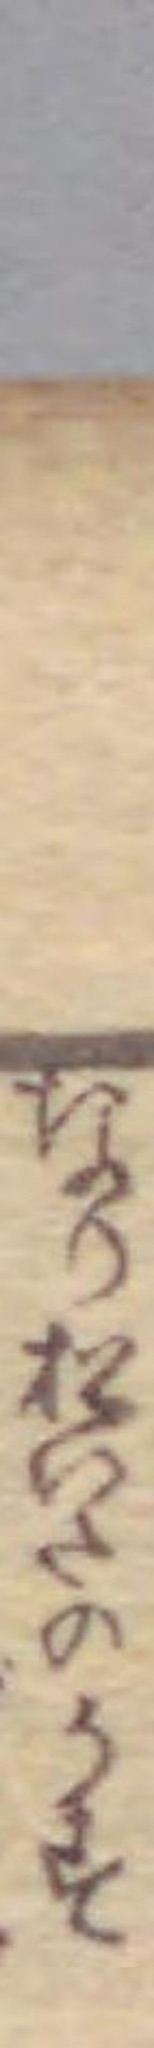なり松いたのうす
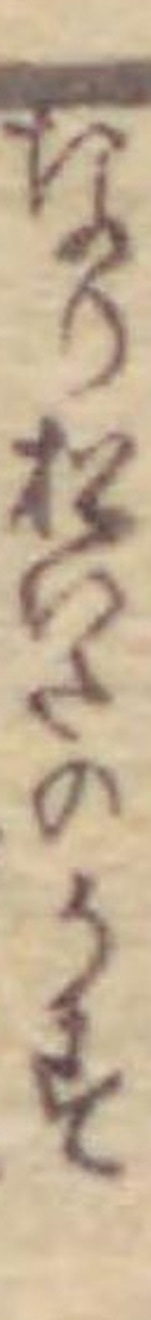なり松いたのうす
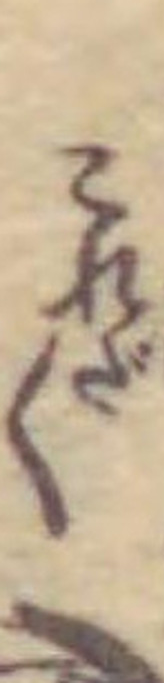これだ
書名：御誂染長寿小紋 : 3巻
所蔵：国立国会図書館 National Diet Library, JAPAN
